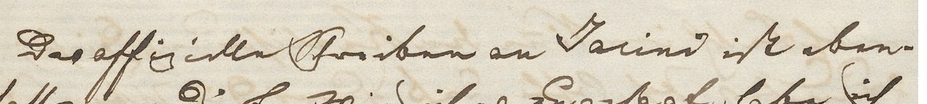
Das offizielle Schreiben an Jacini ist eben-
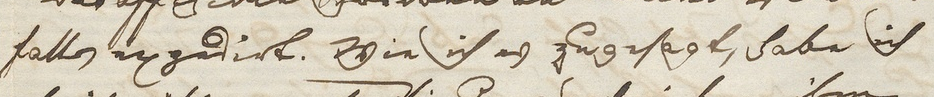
falls expedirt. Wie ich es zugesagt, habe ich
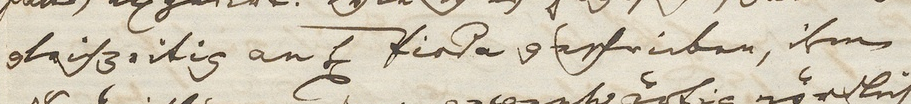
gleichzeitig an H. Pioda geschrieben, ihm
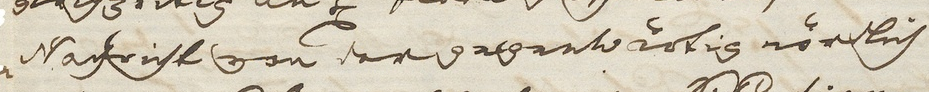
Nachricht von der gegenwärtig nördlich
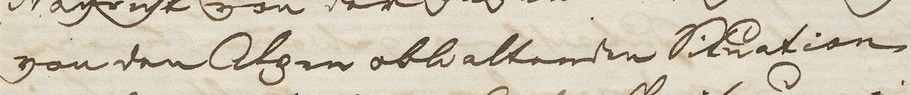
von den Alpen obwaltenden Situation
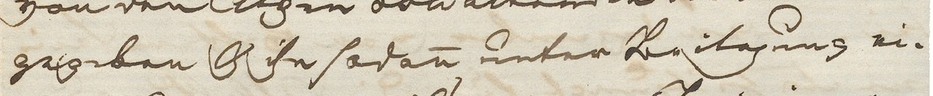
gegeben & ihn sodann unter Beilegung ei-
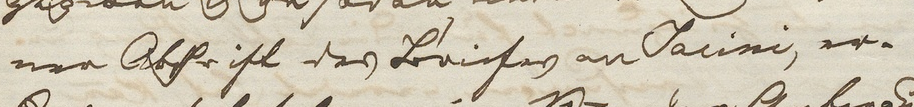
ner Abschrift des Briefes an Jacini, er-
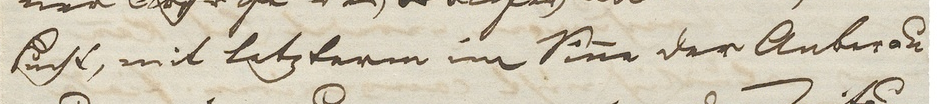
sucht, mit letzterm im Sinne der Anberau-
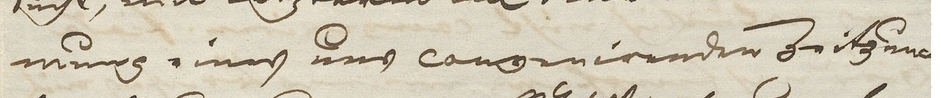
mung eines uns convenirenden Zeitpunc-
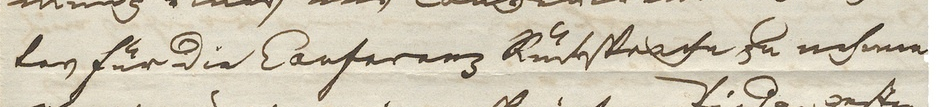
tes für die Conferenz Rücksprache zu nehmen.
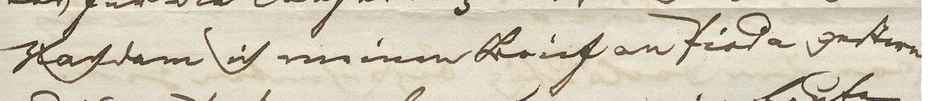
Nachdem ich meinen Brief an Piodagestern
